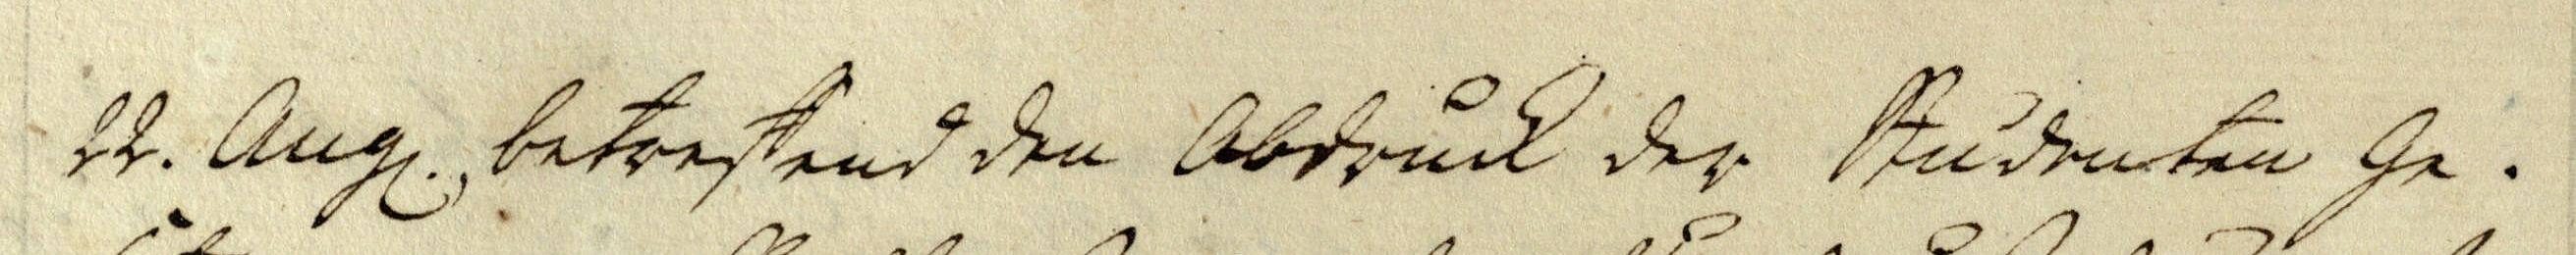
22. Aug. betreffend den Abdruck der Studenten Ge¬
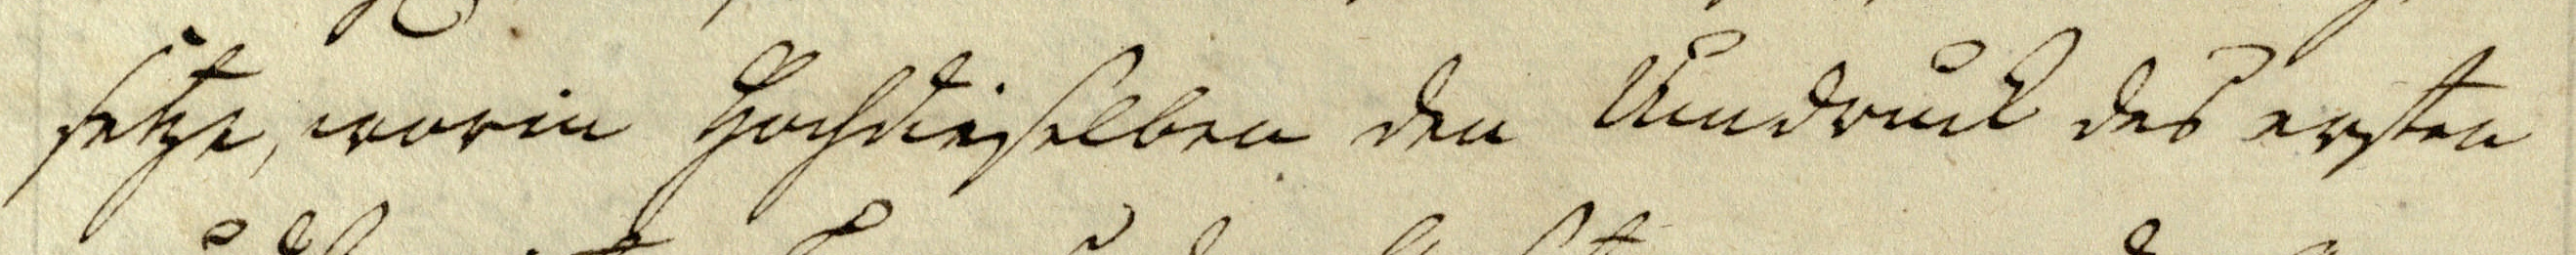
setze, worin Hochdieselben den Umdruck des ersten
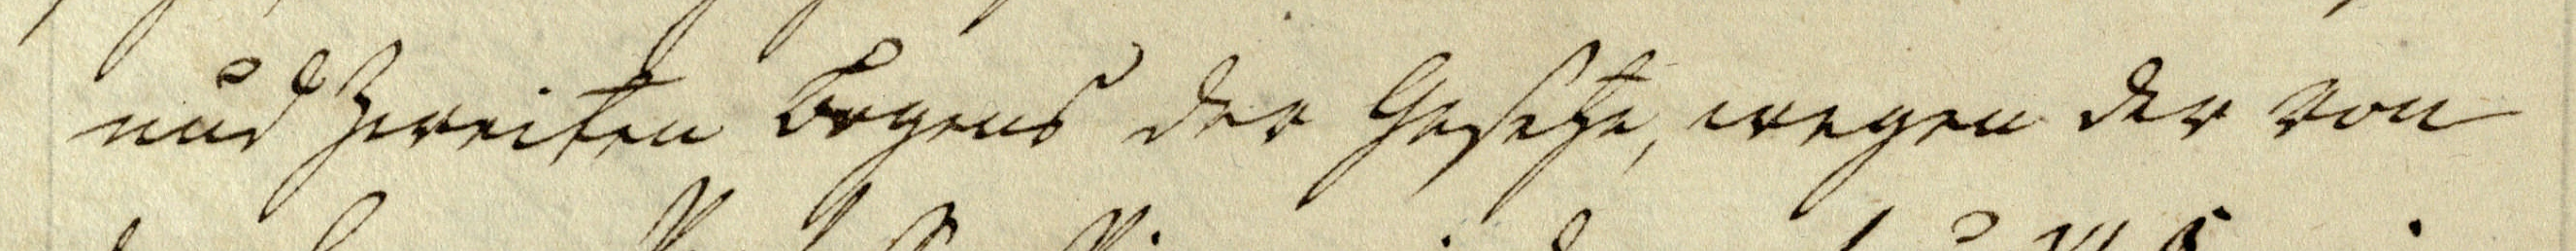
und zweiten Bogens der Gesetze, wegen der von
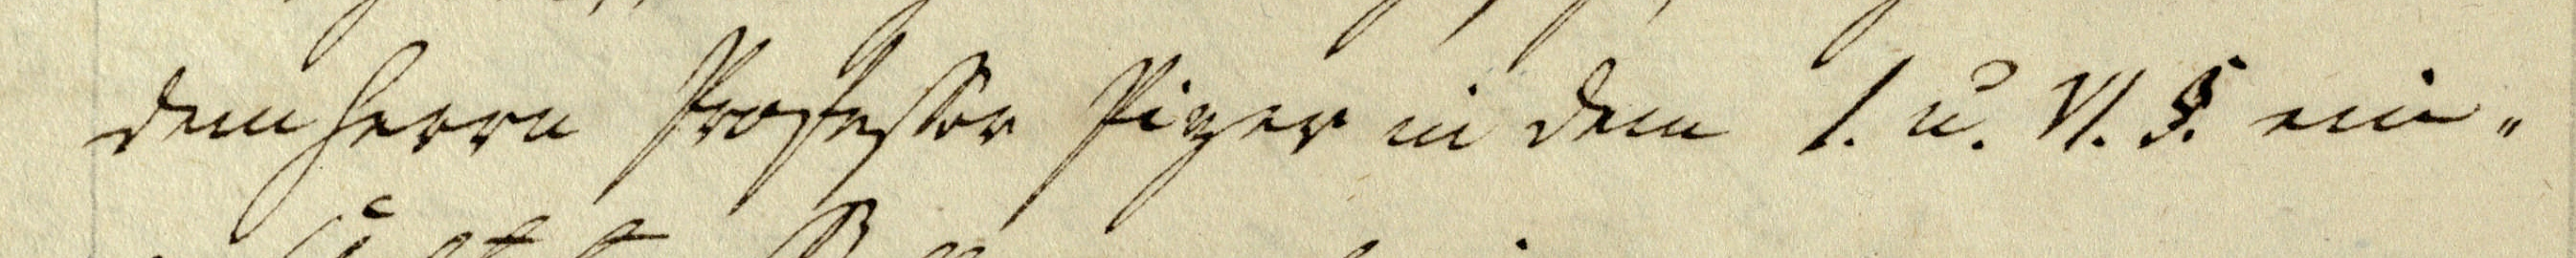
dem Herrn Professor Piper in dem I. u VI. §. ein¬
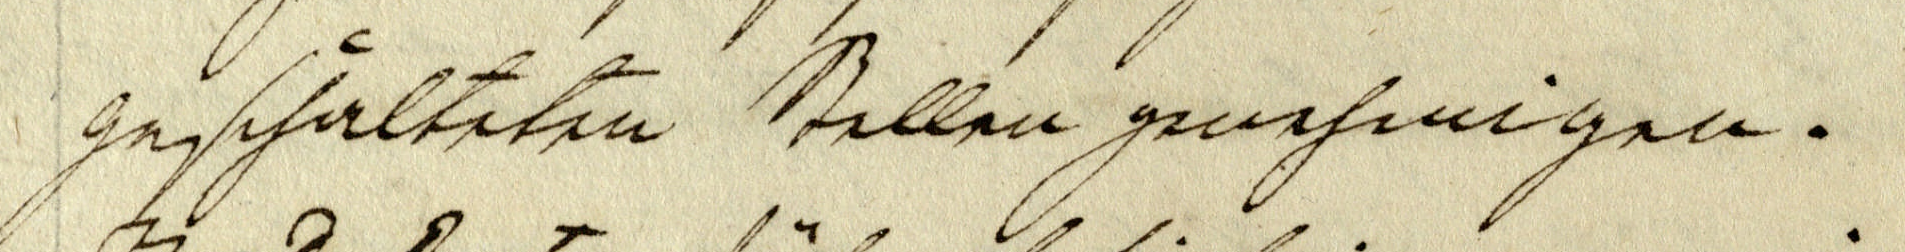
geschalteten Stellen genehmigen.
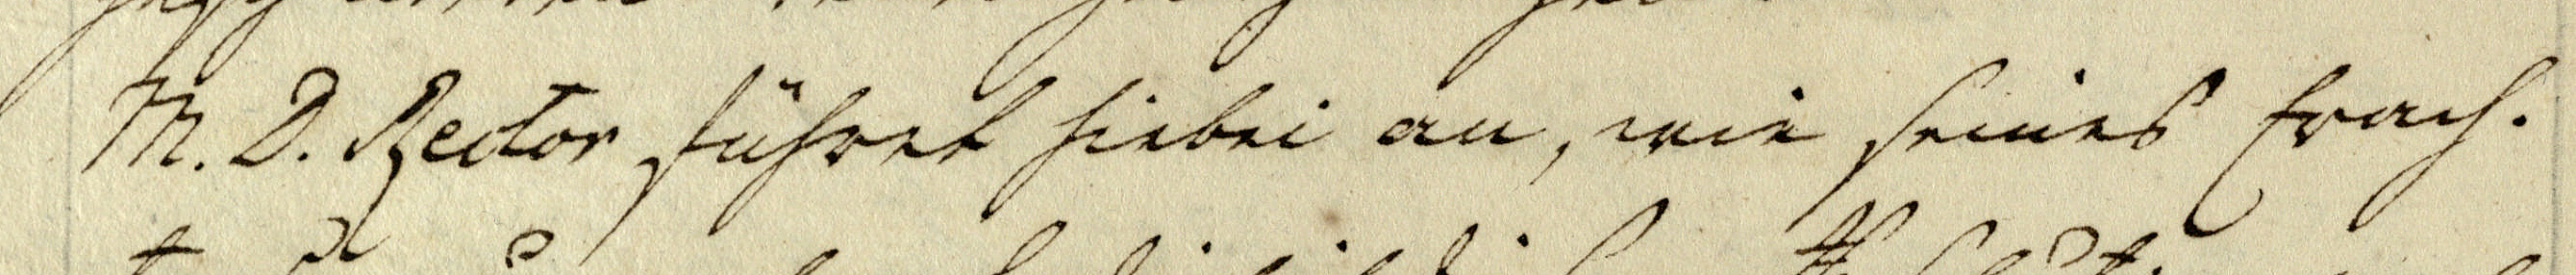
M. D. Rector führet hiebei an, wie seines Erach¬
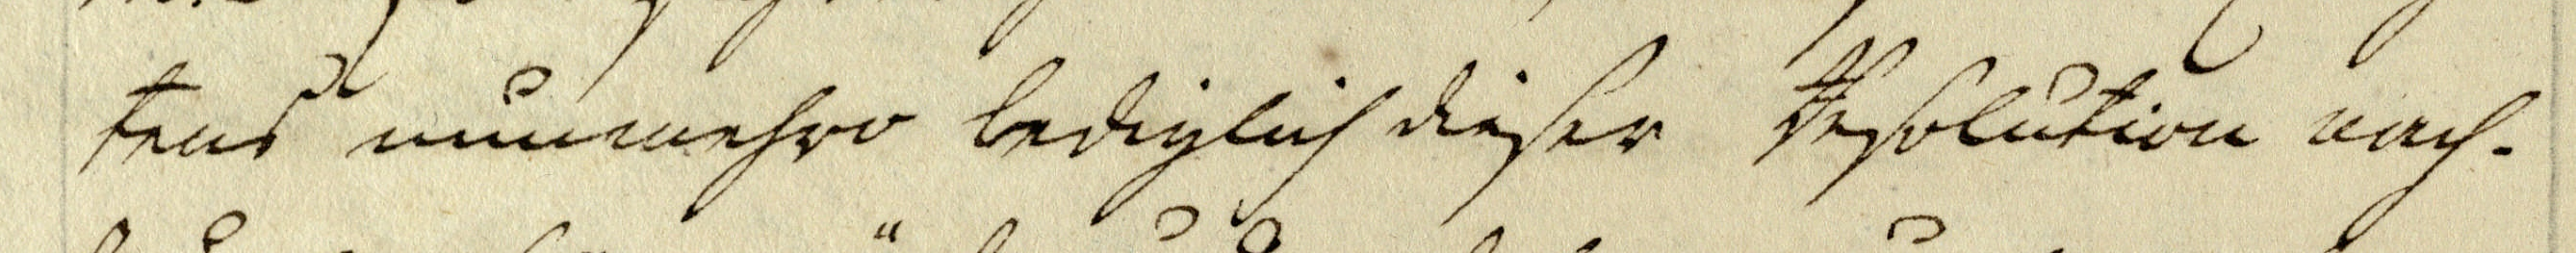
tens nunmehro lediglich dieser Resolution nach¬
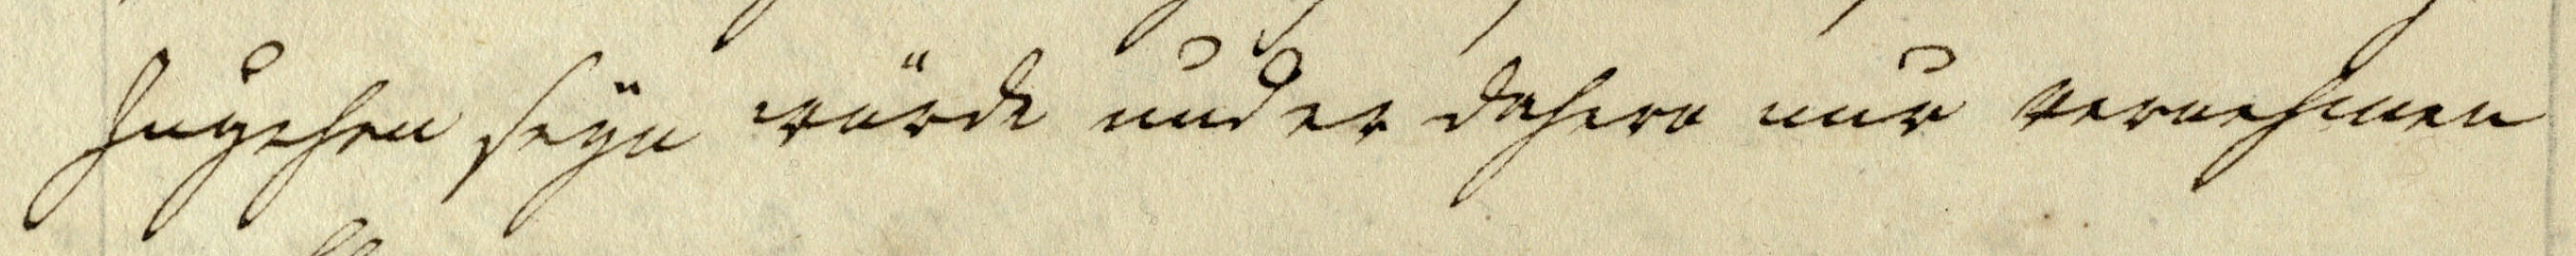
zugehen seyn würde und er dahero nur vernehmen
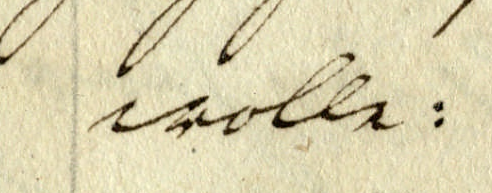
wolle:
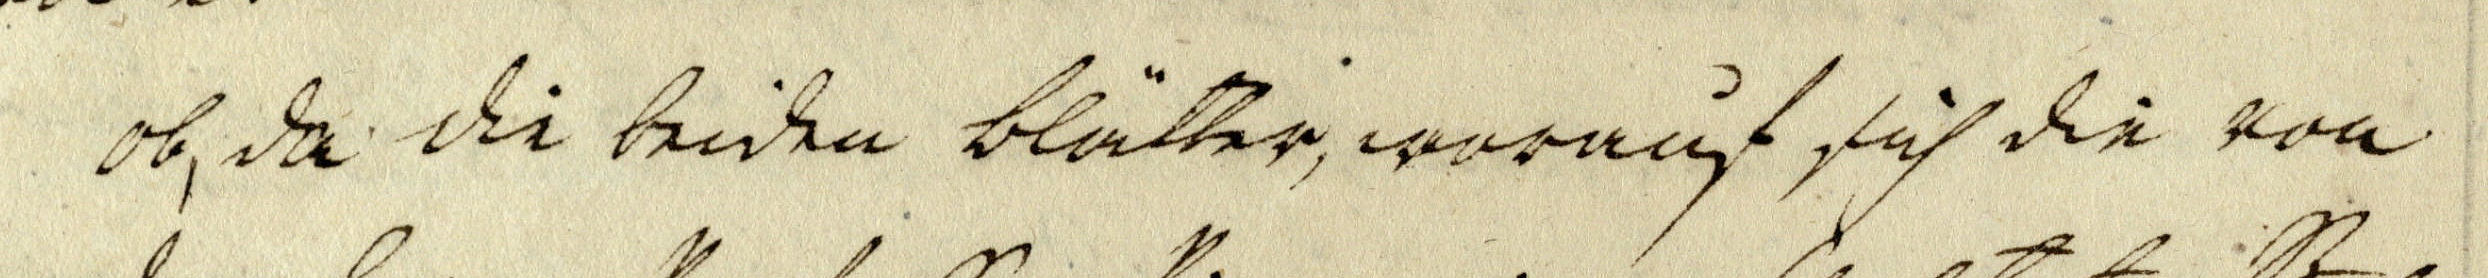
ob, da die beiden Blätter, worauf sich die von
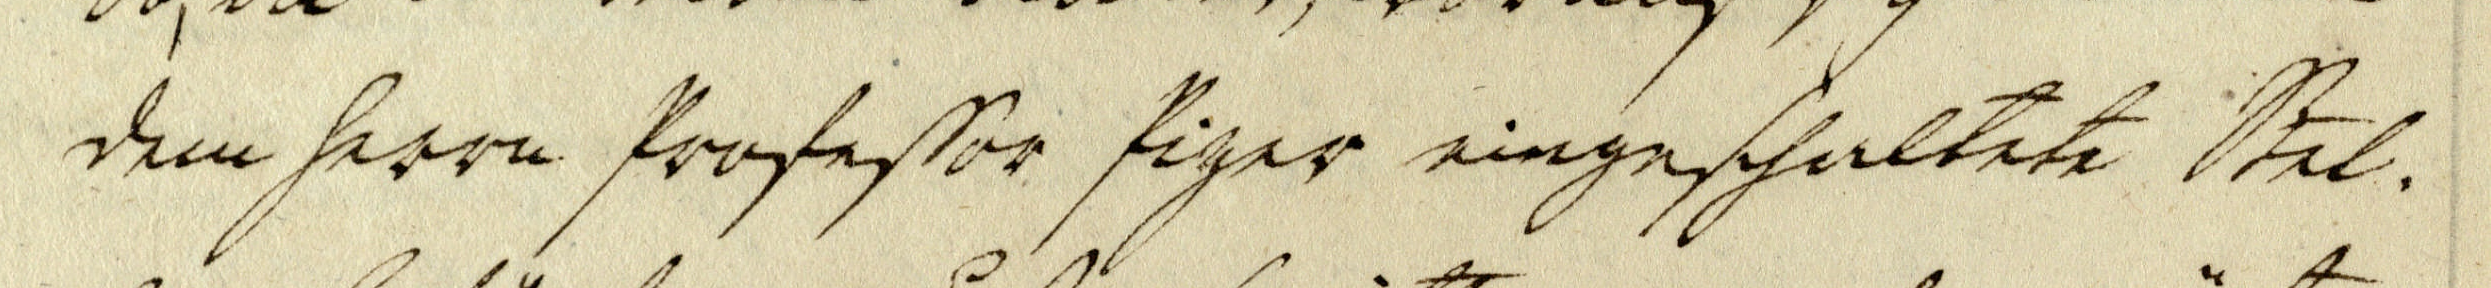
dem Herrn Professor Piper eingeschaltete Stel¬
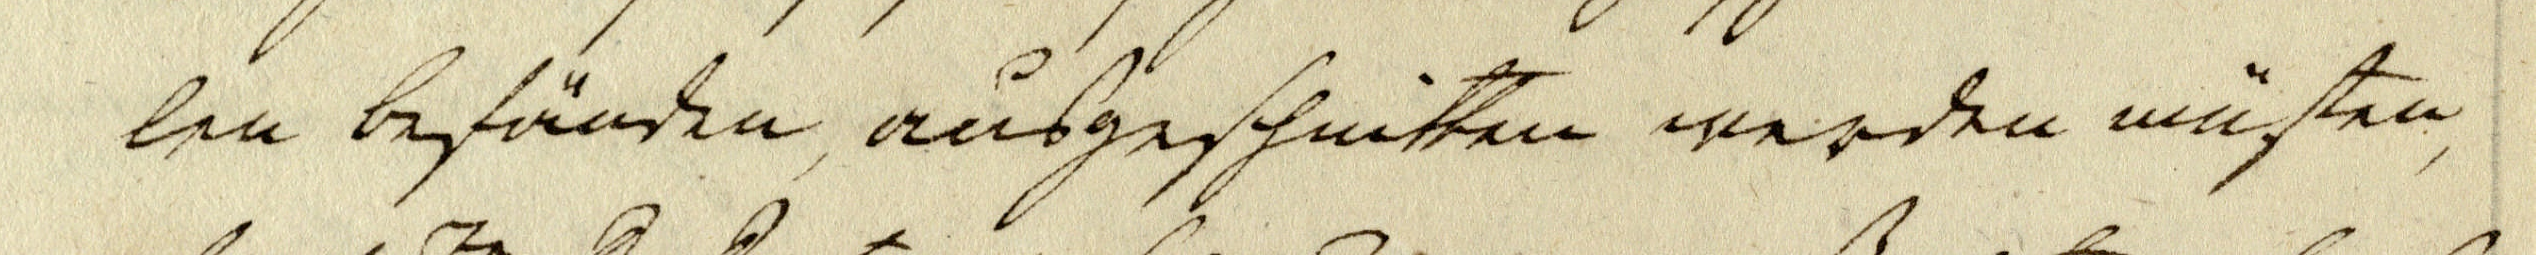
len befänden ausgeschnitten werden müßten,
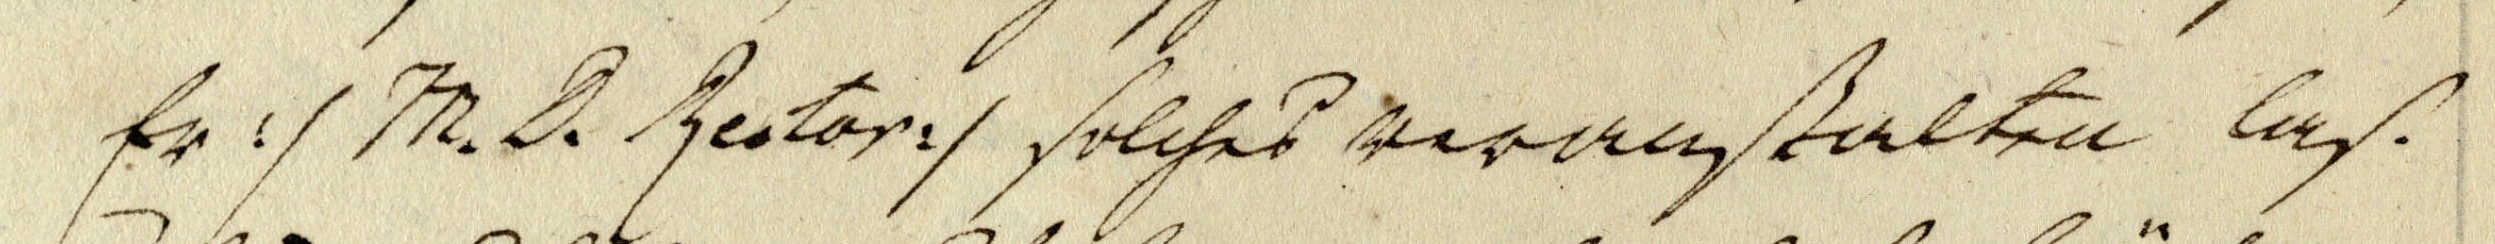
Er :/ M. D. Rector :/ solches veranstalten las¬
